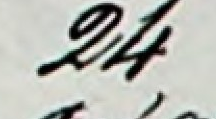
24
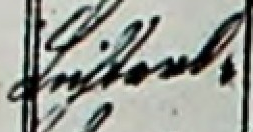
Lichterl„
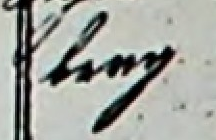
berg
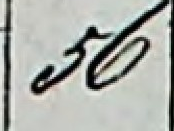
56
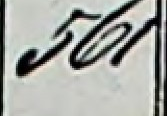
561
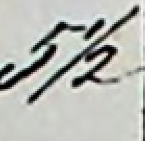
5 1/2
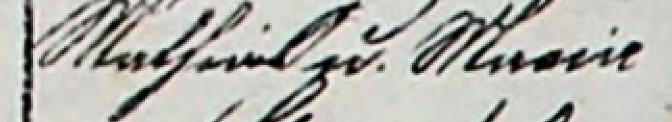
Mathias u. Maria
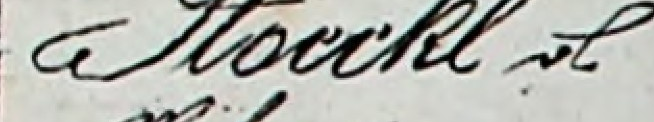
Stoeckl v.
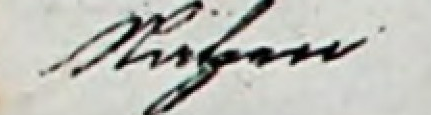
Matzen
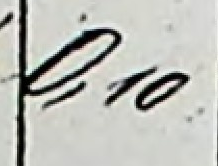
0,10
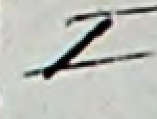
I
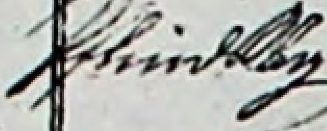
Pflindsbg
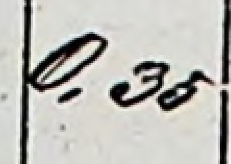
0,35
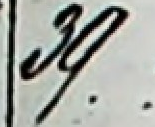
39
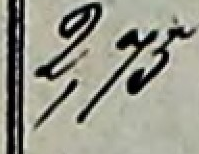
2,75
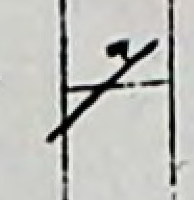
7
